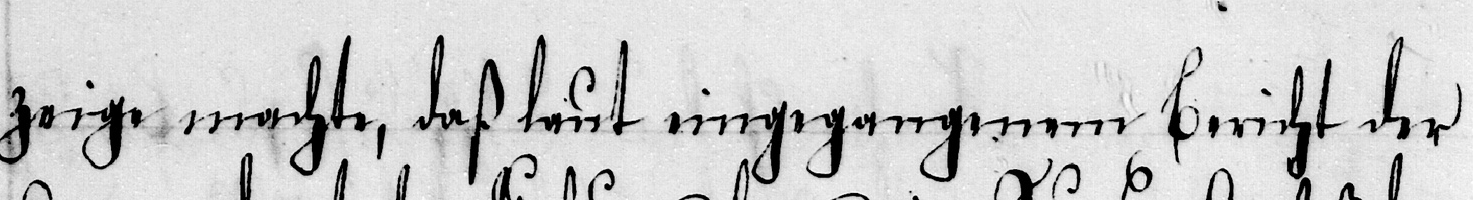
zeige machte, daß laut eingegangenem Bericht der
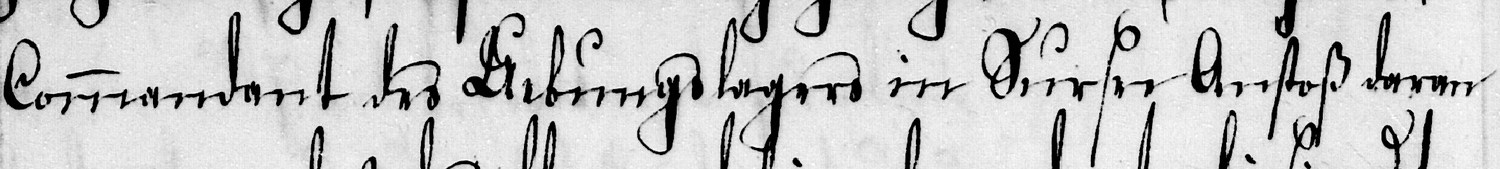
Commandant des Uebungslagers in Sursee Anstoß daran
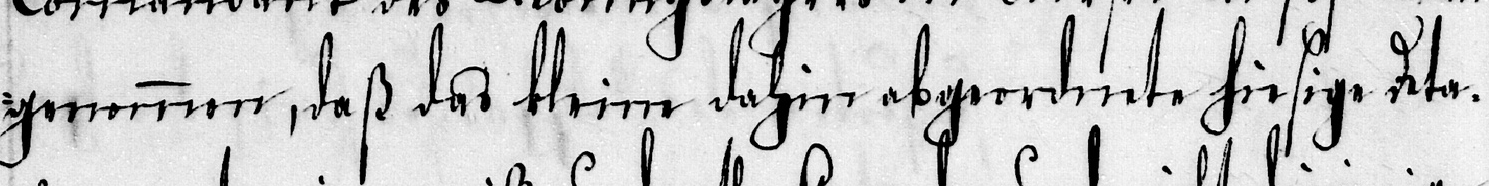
genommen, daß das kleine dahin abgeordnete hiesige Deta¬
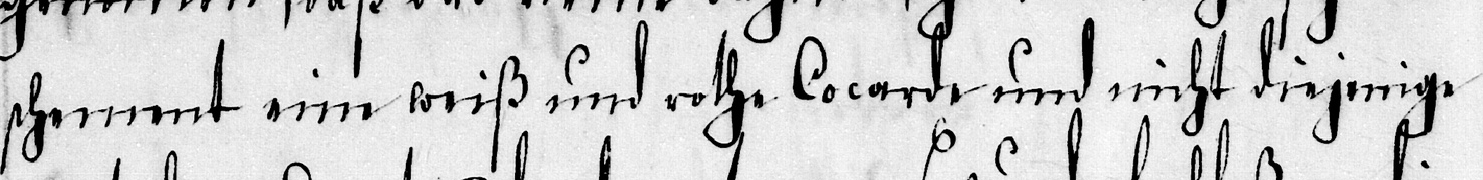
schement eine weiß und rothe Cocarde und nicht diejenige
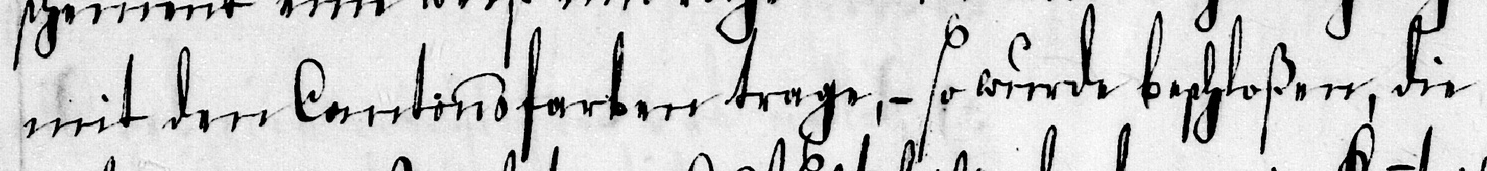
mit den Cantonsfarben trage, – so wurde beschloßen, die
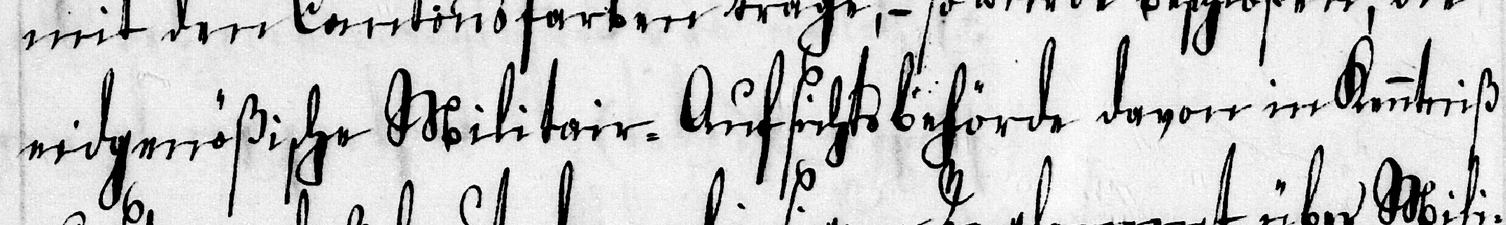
eidgenößische Militair-Aufsichtsbehörde davon in Kenntniß
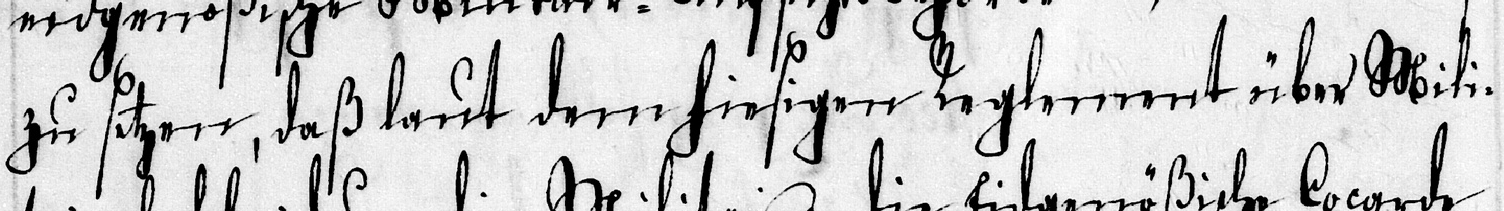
zu setzen, daß laut dem hiesigen Reglement über Mili¬
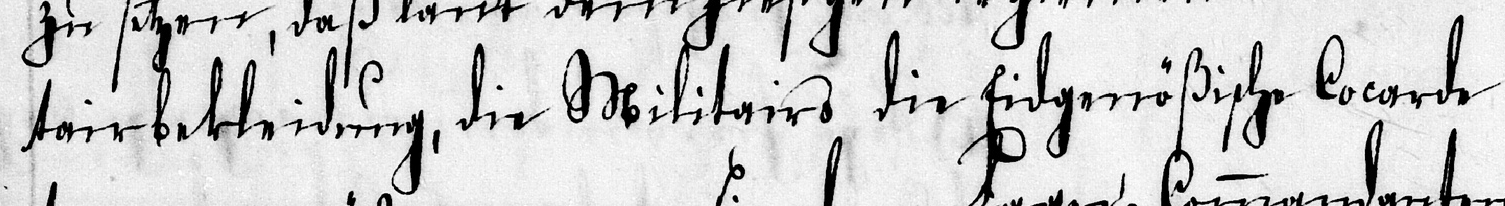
tairbekleidung, die Militairs die Eidgenößische Cocarde
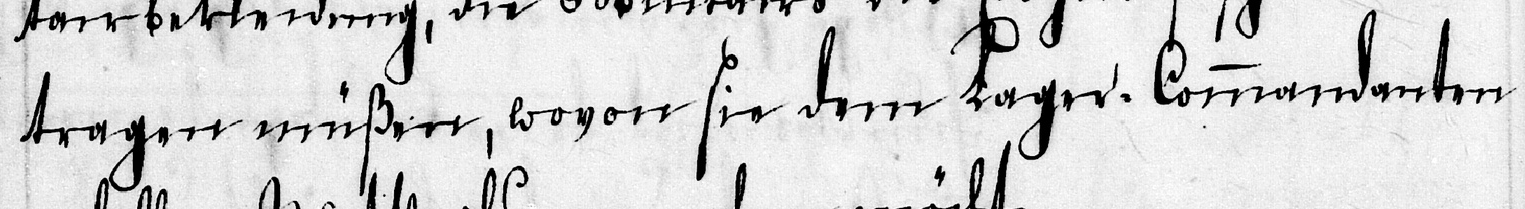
tragen müßen, wovon sie dem Lager-Commandanten
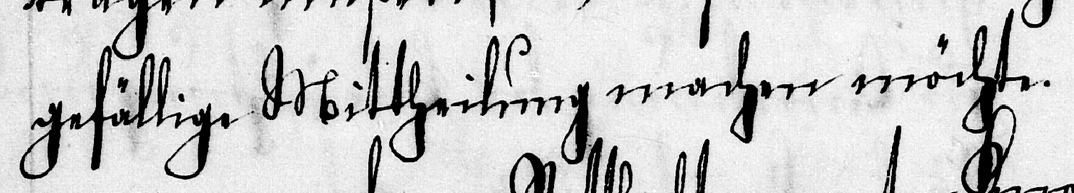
gefällige Mittheilung machen möchte.
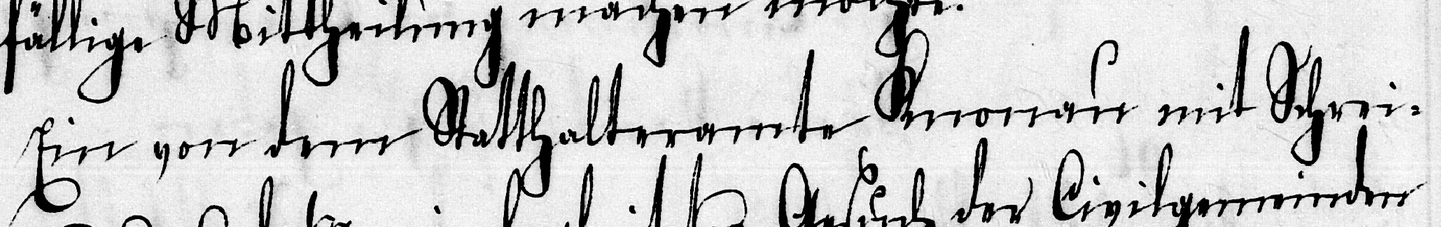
Ein von dem Statthalteramte Knonau mit Schrei¬
